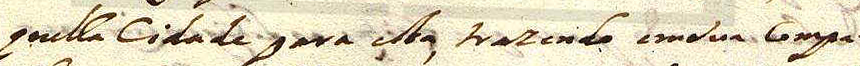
quella Cidade para esta, trazendo em sua compa
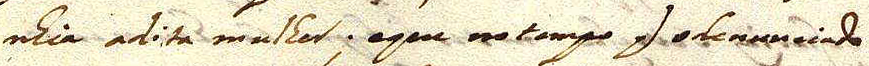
nhia a dita mulher; e que no tempo q̄ o denunciado
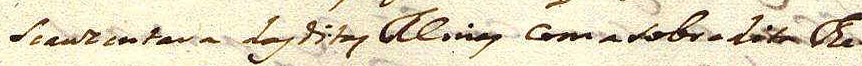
se auzentara das ditas Minas com a sobredita The
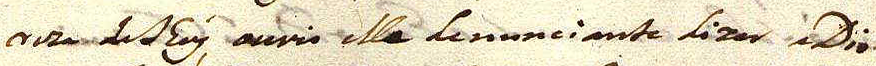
reza de Ihūs, ouvio elle denunciante dizer a Dio
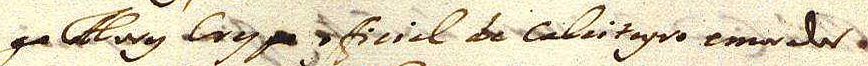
go Alvres Crespo official de Calciteyro e morador
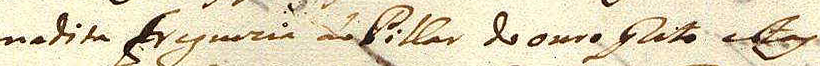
na dita freguezia do Pillar do ouro preto estas
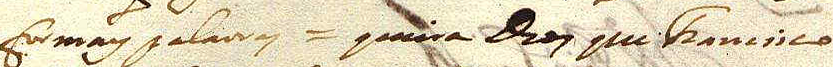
formaes palavras = queira Deos que Francisco
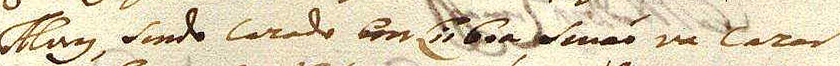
Alvres, sendo cazado em Lisboa, se naõ va Cazar
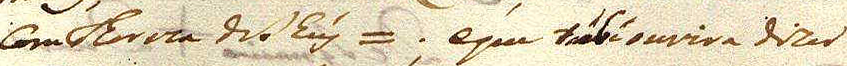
Com Thereza de Ihū s= ; e que taõbē ouvira dizer
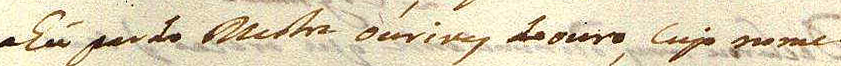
a hū pardo Mestre ourives do ouro, cujo nome
